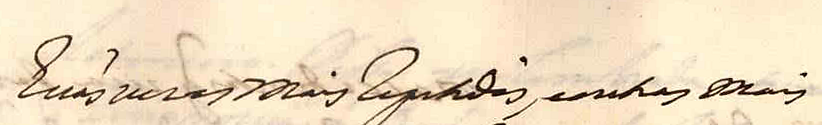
huās uezes mais Repetidas, e outras mais
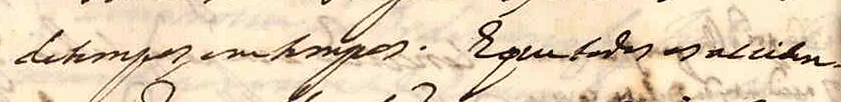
de tempos em tempos. E que todos os acciden
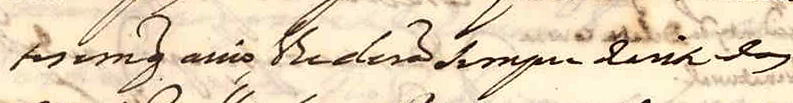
tes em q̄ a uio lhe deraõ sempre diante das
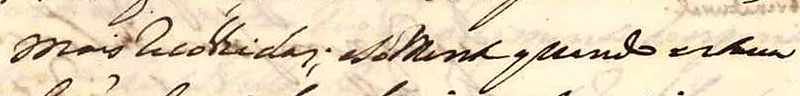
mais Recolhidas; e soMente quando estaua
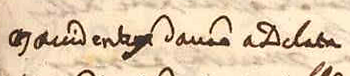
os accidentes dauaõ a Delata
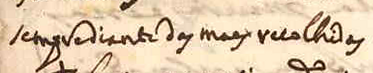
sempre diante das mais recolhidas
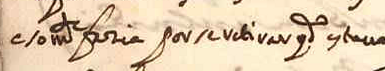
e somte fazia por se retirar qdo estaua
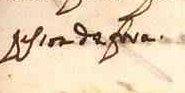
pessoa de fora.
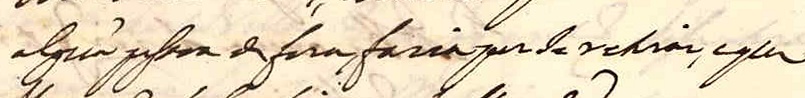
alguā pessoa de fora, fazia por se retirar, e que
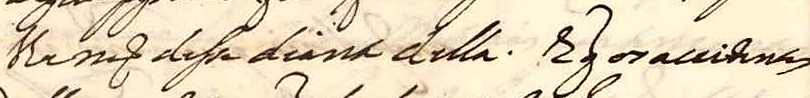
lhe naõ desse diante della; E q̄ os accidentes
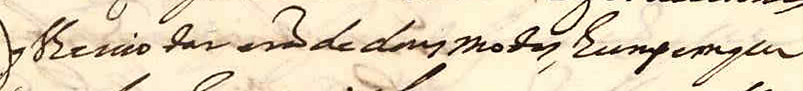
q̄ lhe uio dar eraõ de dous modos, huns em que
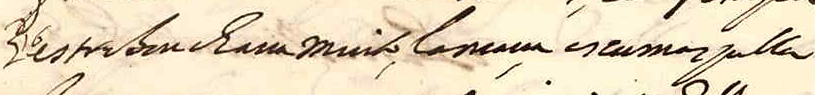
Estrebouchaua muito, lançaua escumas pella
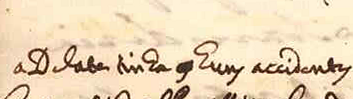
a Delato tinha os huns accidentes
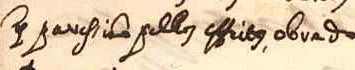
q̄ paressiaõ pellos effeitos, obra do
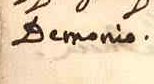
Demonio.
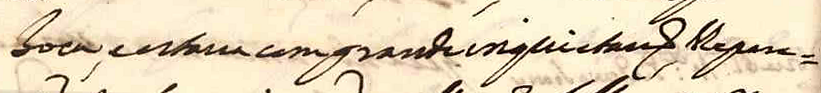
boca, e estaua com grande inquietaçaõ, lhe para
